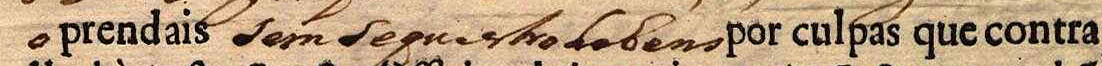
o prendais sem sequestro de bens por culpas que contra
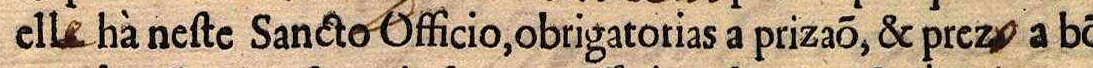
elle hà neste Sancto Officio, obrigatorias a prizaõ, & prezo a bō
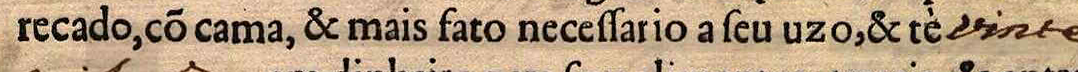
recado, cō cama, & mais fato necessario a seu uzo, & tè vinte
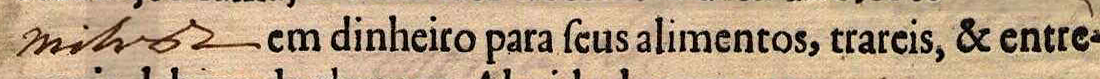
mil rs̄ em dinheiro para seus alimentos, trareis, & entre
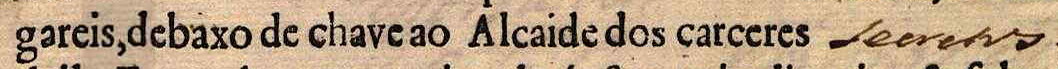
gareis, debaxo de chave ao Alcaide dos carceres secretos
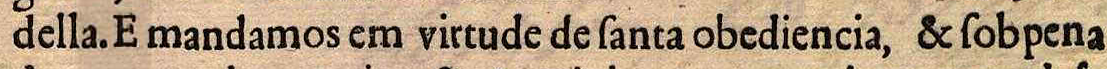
della. E mandamos em virtude de santa obediencia, & sob pena
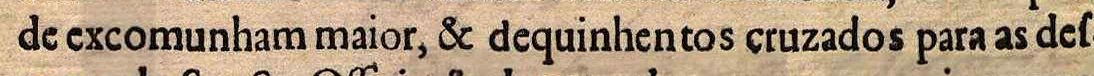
de excomunham maior, & de quinhentos cruzados para as des
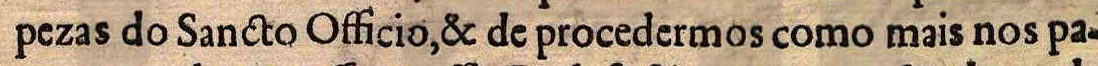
pezas do Sancto Officio, & de procedermos como mais nos pa
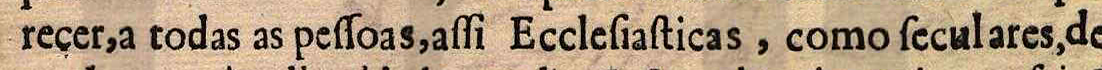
recer, a todas as pessoas, assi Ecclesiasticas, como seculares, de
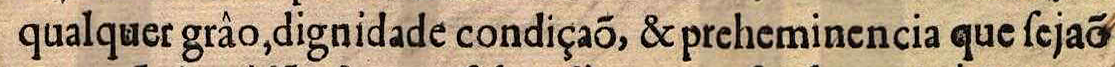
qualquer grâo, dignidade condiçaõ, & preheminencia que sejaõ
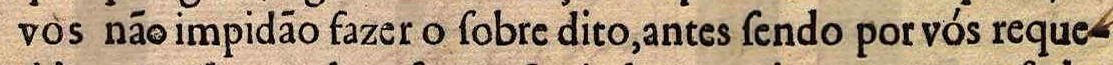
vos não impidão fazer o sobredito, antes sendo por vós reque
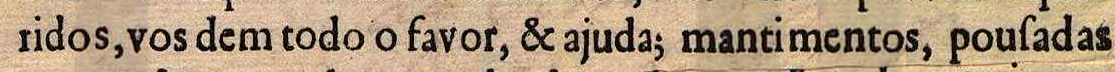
ridos, vos dem todo o favor, & ajuda; mantimentos, pousadas
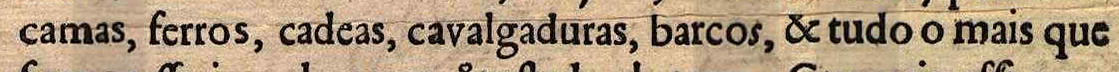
camas, ferros, cadeas, cavalgaduras, barcos, & tudo o mais que
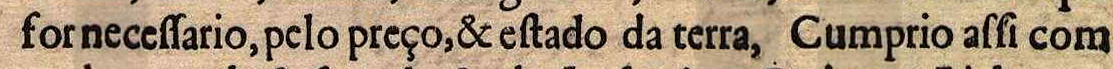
for necessario, pelo preço, & estado da terra, Cumprio assi com
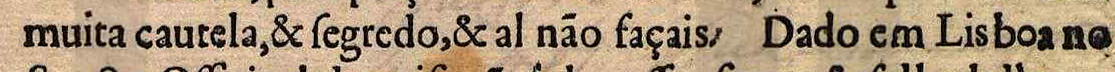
muita cautela, & segredo, & al não façais. Dado em Lisboa no
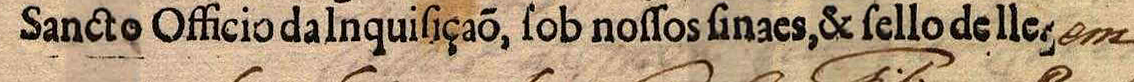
Sancto Officio da Inquisiçaõ, sob nossos sinaes, & sello delles em
